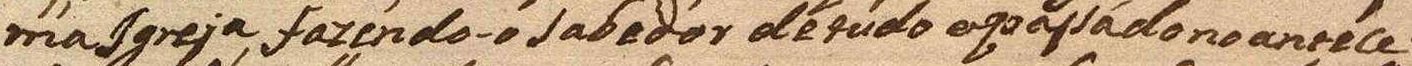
ma Igreja, fazendo-o sabedor de tudo o passado no antece
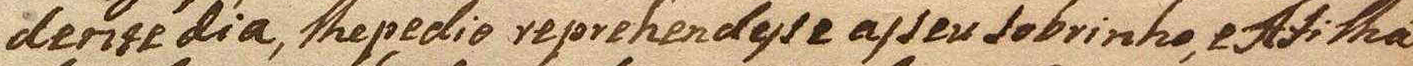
dente dia, lhe pedio reprehendesse a sseu sobrinho, e Afilha
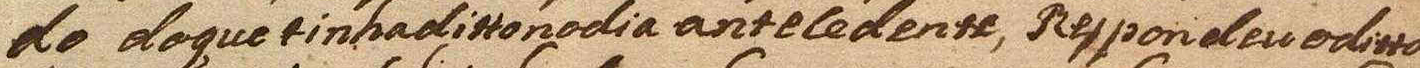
do do que tinha ditto no dia anteCedente, Respondeu o ditto
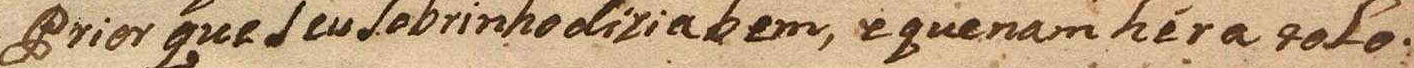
Prior que seu sobrinho dizia bem, e que nam héra toLo.
